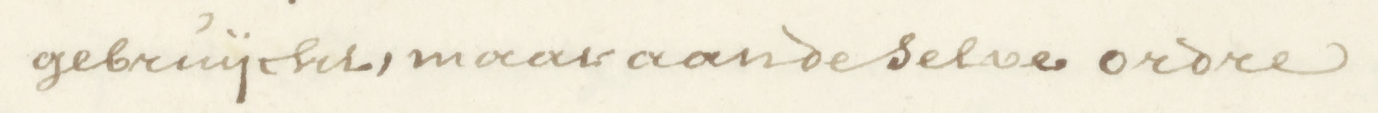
gebruijckt, maar aan deselve ordre
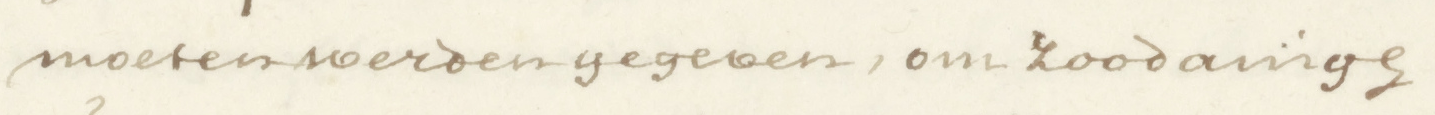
moeten werden gegeven, om zoodanigh
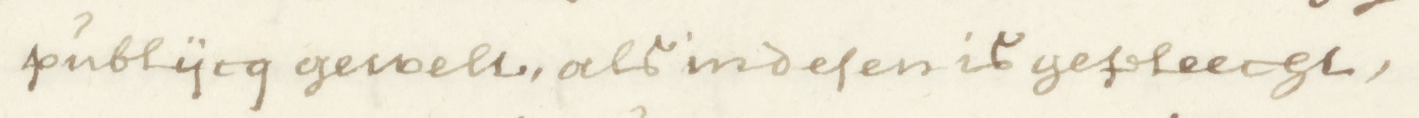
publijcq gewelt, als indesen is gepleecht,
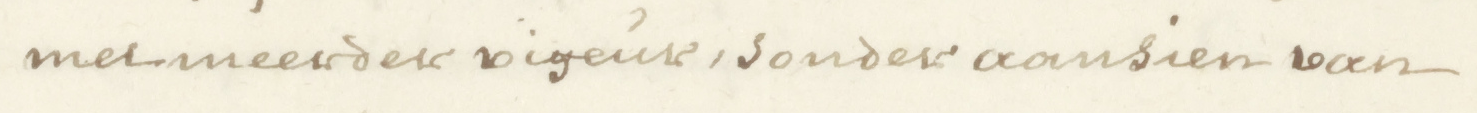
met meerder vigeur, sonder aansien van
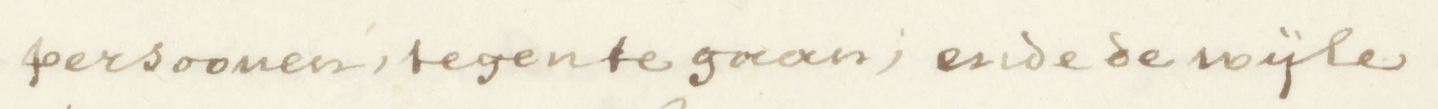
persoonen, tegen te gaan; ende de wijle
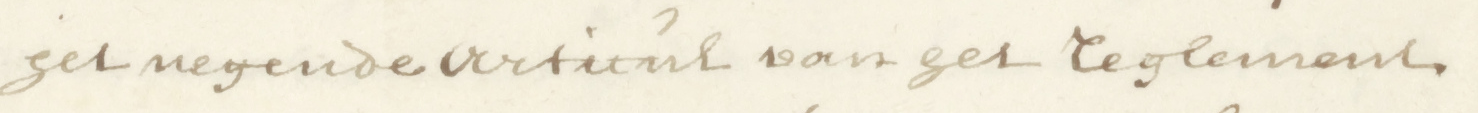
het negende articul van het reglement
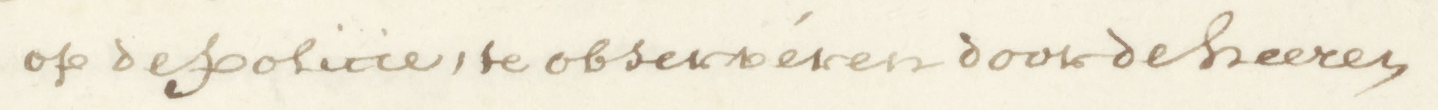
op de policie, te observeren door de heeren
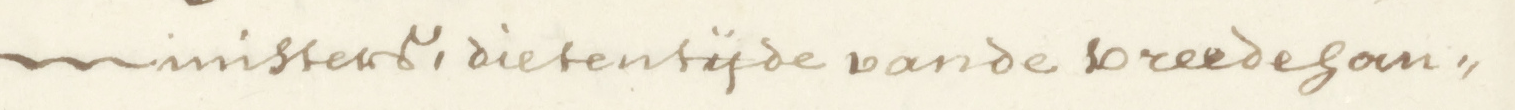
ministers, dietentijde vande breede han„
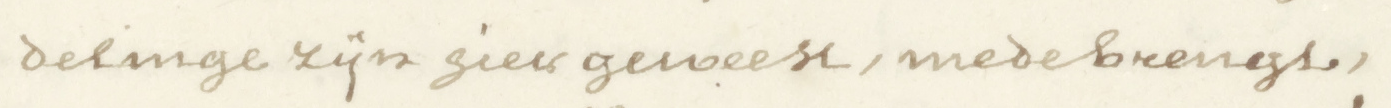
delinge zijn hier geweest, medebrengt,
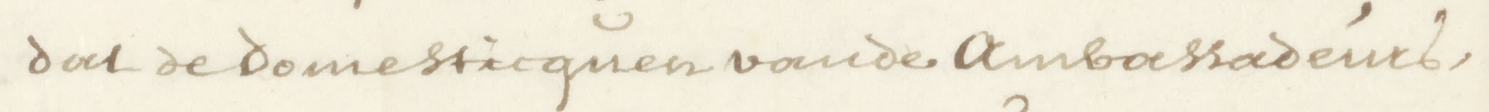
dat de domesticquen vande Ambassadeurs,
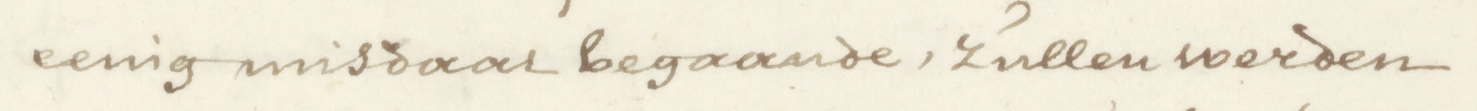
eenig misdaat begaande, zullen werden
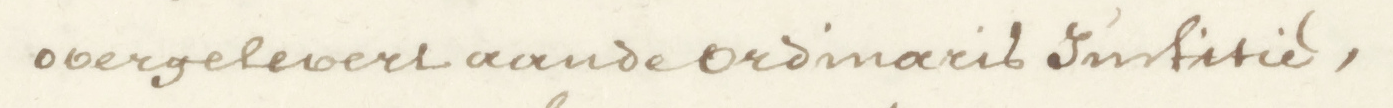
overgelevert aande ordinaris iustitie,
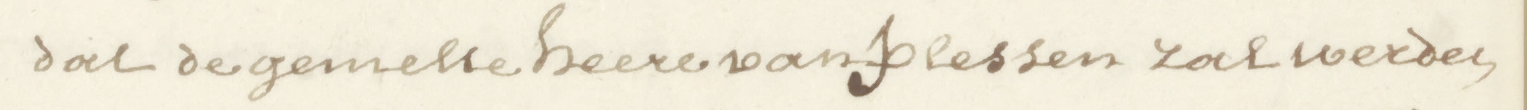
dat de gemeelte heere van Plessen zal werden
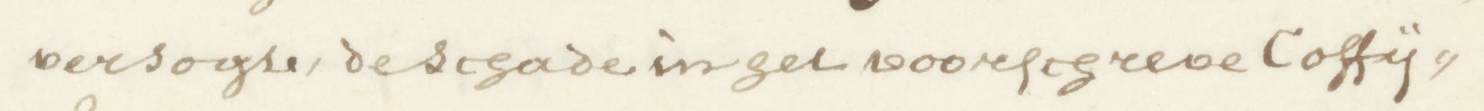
versogt, de schade in het voorschreve coffij„
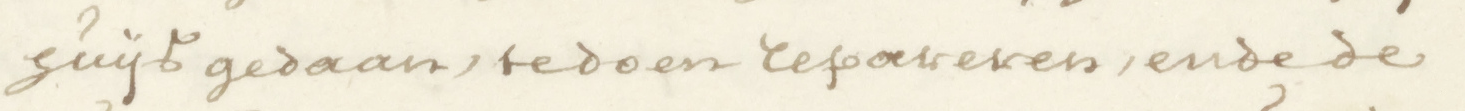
huijs gedaan, te doen repareren, ende de
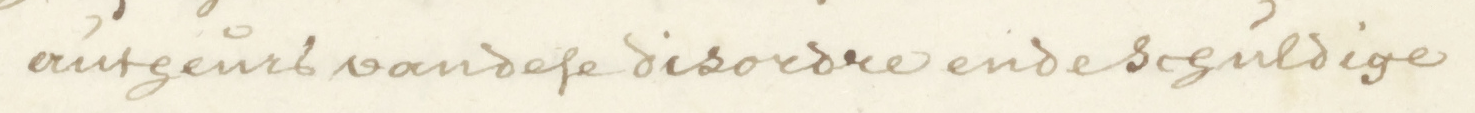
autheurs van dese disordre ende schuldige
